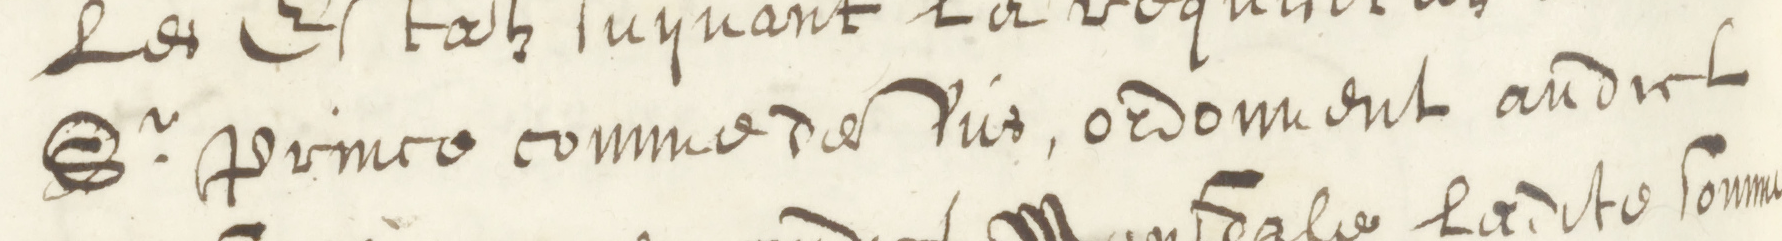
Sr. Prince comme dessus, ordonnent audict
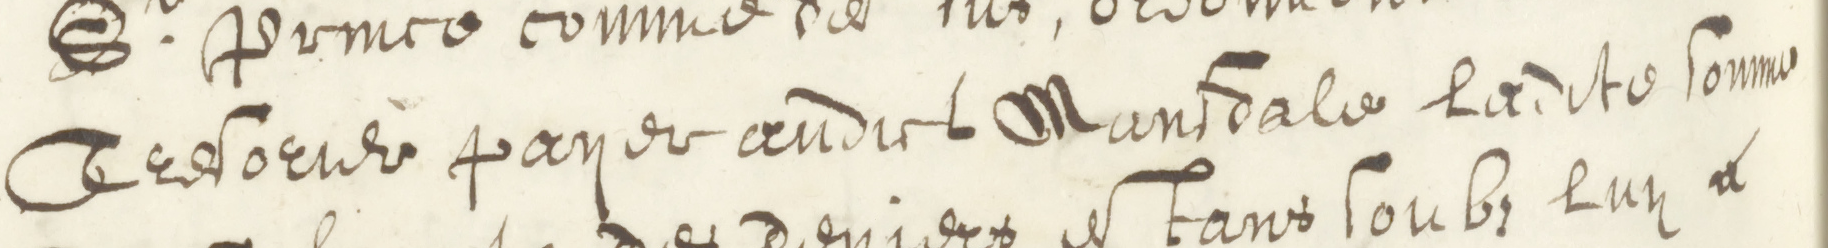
Tresorier payer audict Mansdale ladite somme
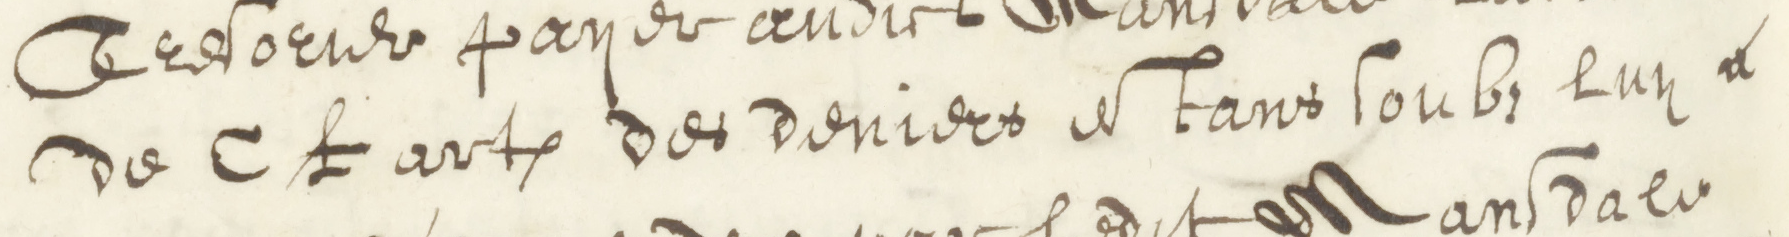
de C L. arth des deniers estans soubz luy a
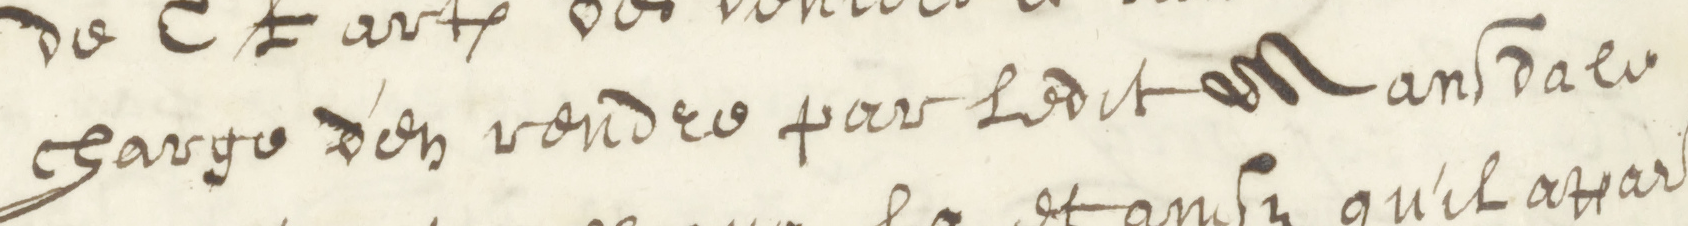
charge d'en rendre par ledit Mansdale
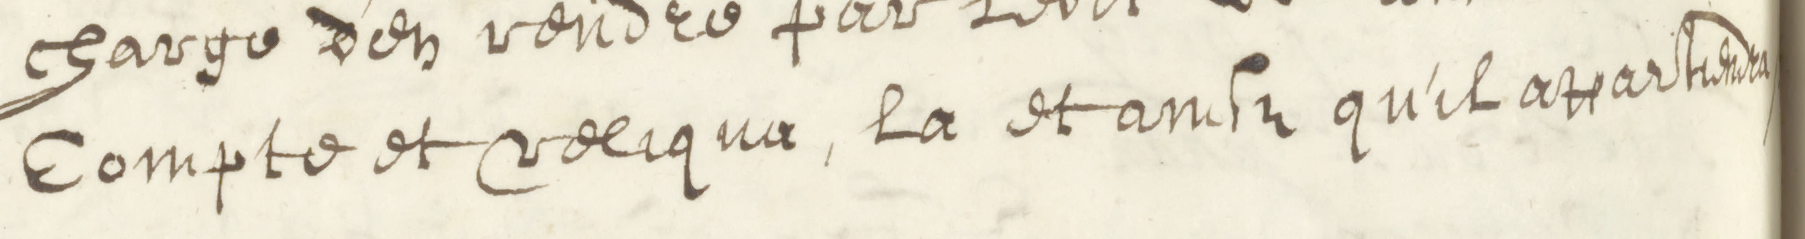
Compte et reliqua, la et ainsy qu‛il appartiendra
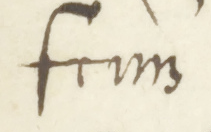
fcum
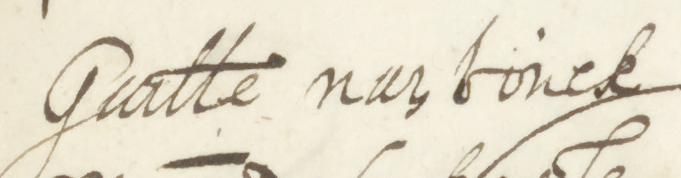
Guille nuytinck
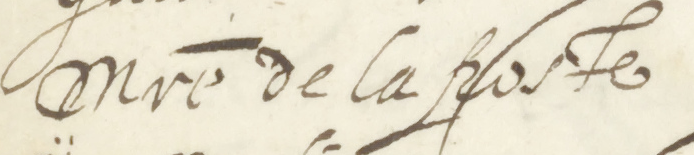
Mre de la Poste
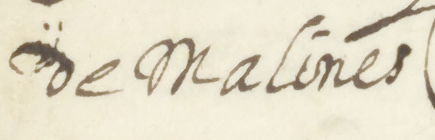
De Malines
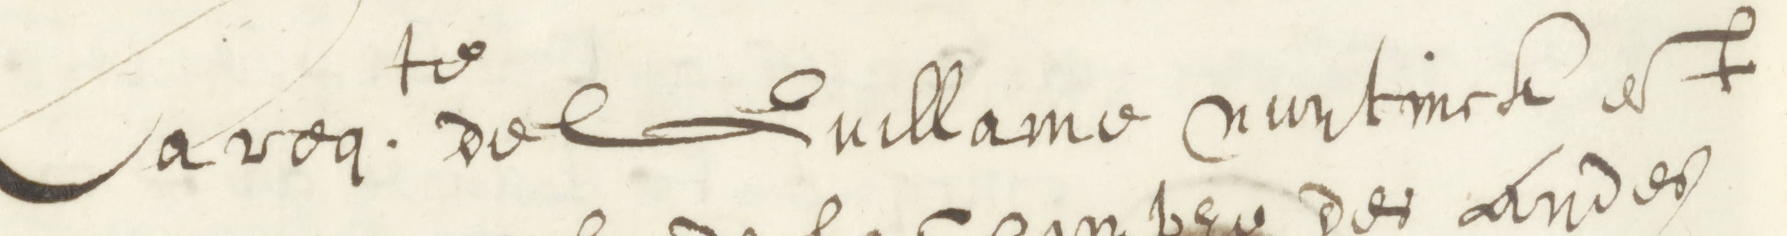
La reqte. de Guillame nuytinck est
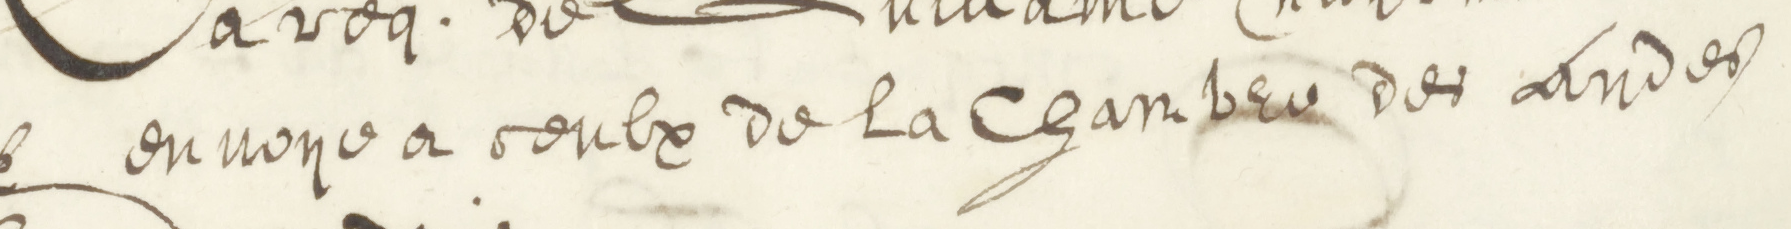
envoye a ceulx de la Chambre des aydes
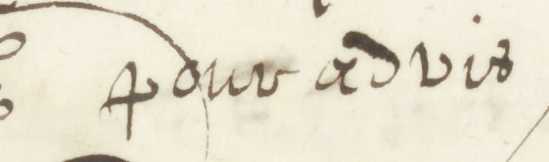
pour advis
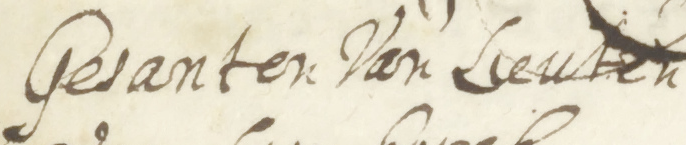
Gesanten van Lieuten
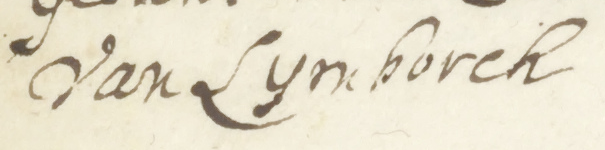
van Lymborch
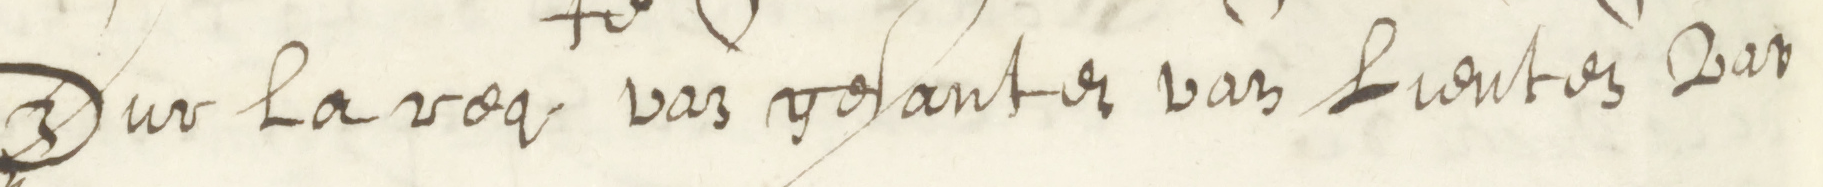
Sur la reqte. van gesanten van Lieuten van
